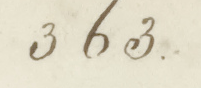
363
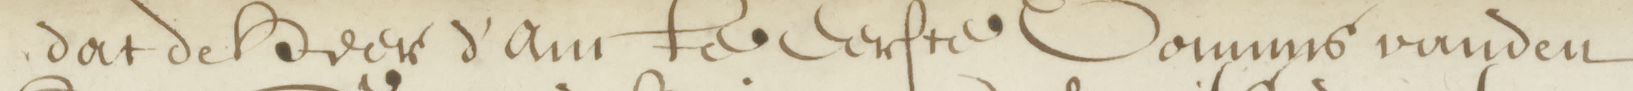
dat de heer d'Anste eerste commis vanden
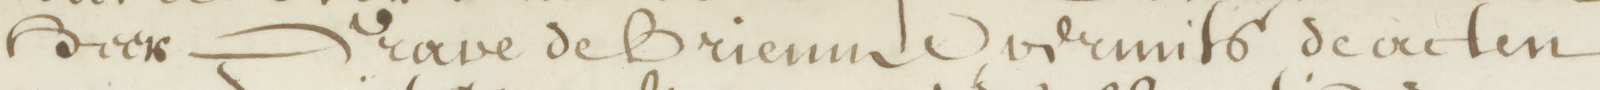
heer Grave de Brienne overmits de acten
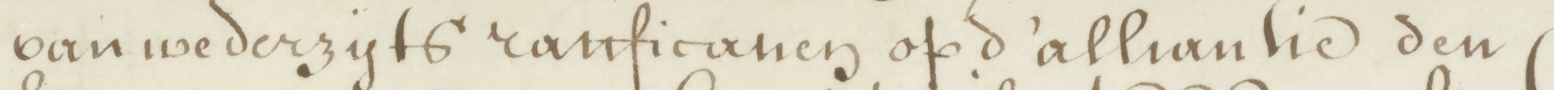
van wederzijts ratificatien op d'alliantie den
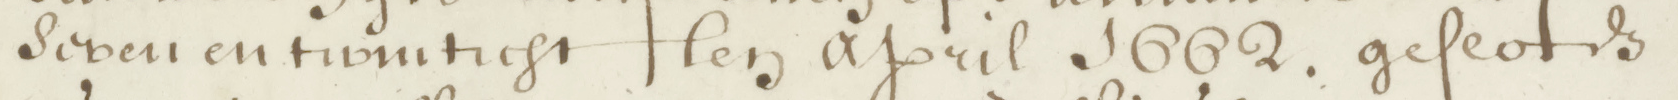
seven en twintichsten april 1662. gesloten
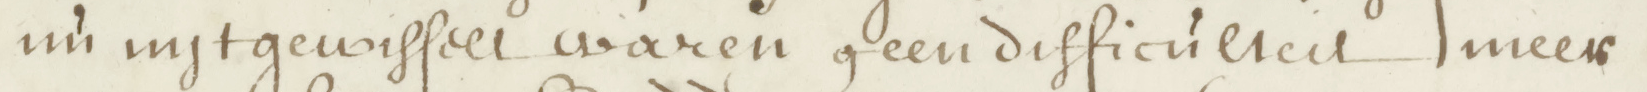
nu uijtgewisselt waren geen difficulteit meer
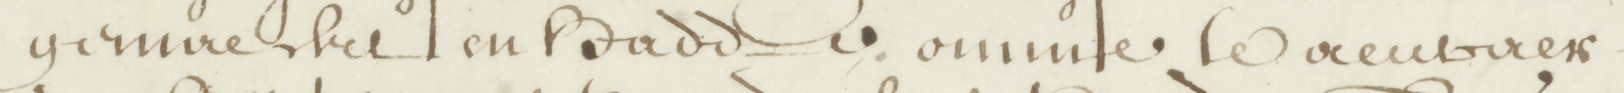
gemaeckt en hadde omme te aenvaer„
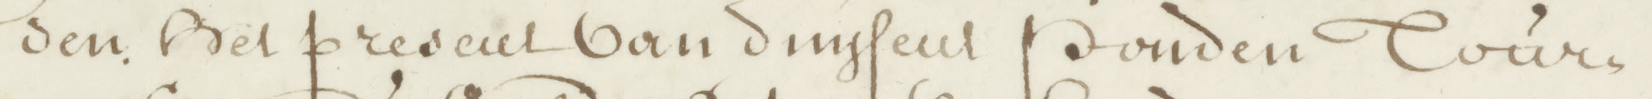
den het present van duysent ponden Tour„
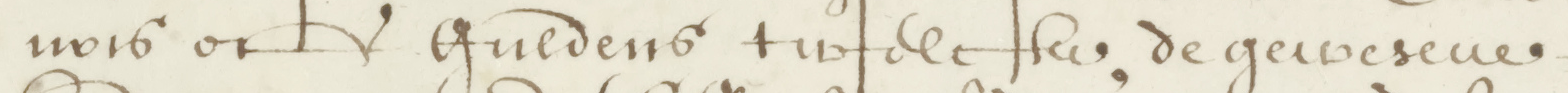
nois off guldens twelcke de gewesene
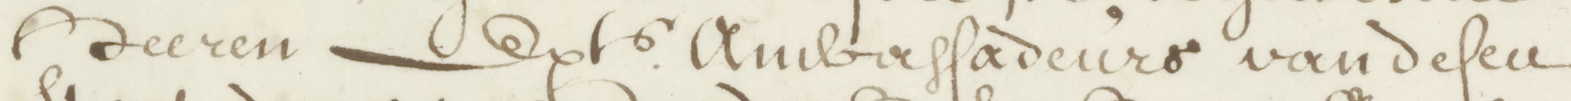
heeren Exts Ambassadeurs van desen
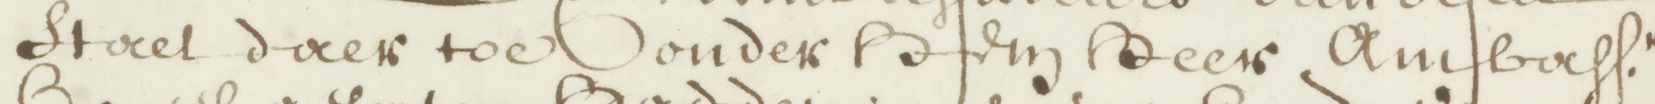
Staet daer toe onder hem heer Ambassr
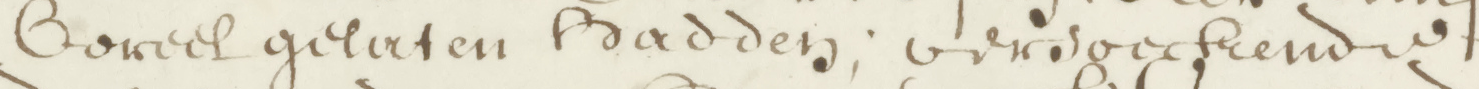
Boreel gelaten hadden; versoeckende
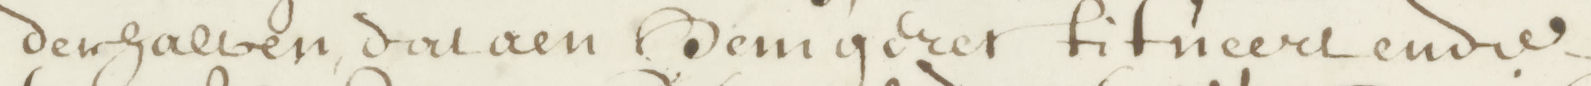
derhalven dat aen hem gerestitueert ende
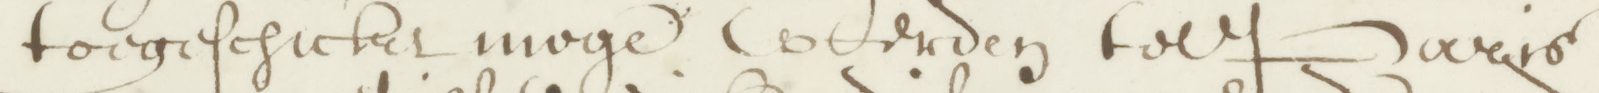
toegeschickt mogen worden tot Paris
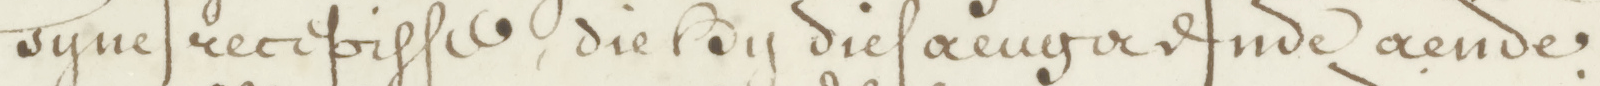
sijne recepisse, die hij dies aengaende aende
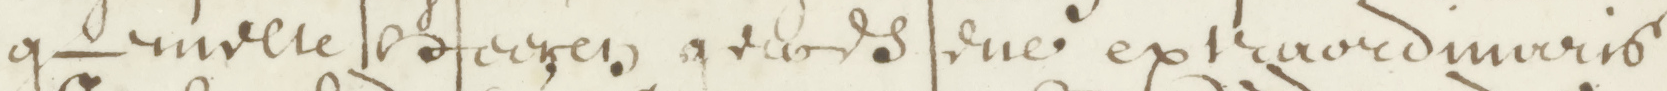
gemelte heeren gewesene extraordinaris
